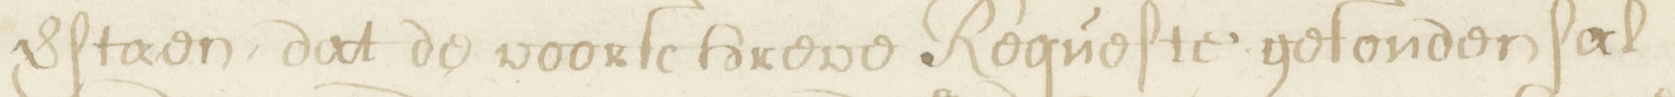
vstaen, dat de voorschreve Requeste gesonden sal
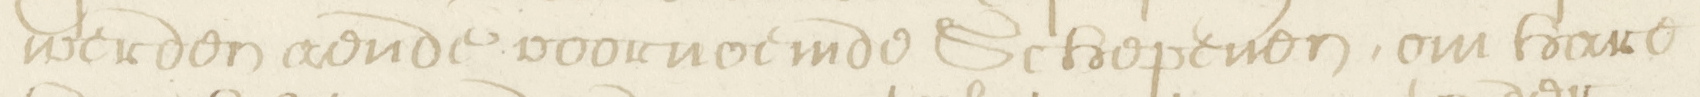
werden aende voornoemde Schepenen, om hare
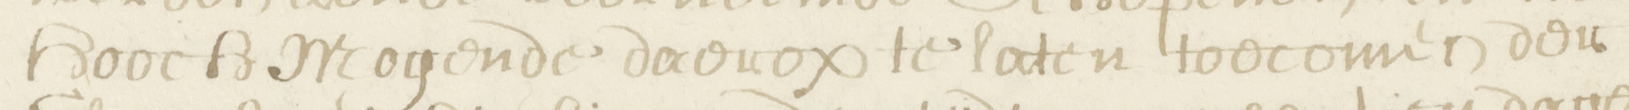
hooch mogende daerop te laten toecomen der
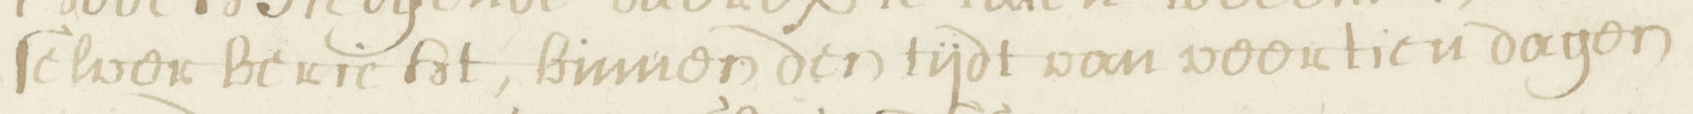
selver bericht, binnen den tijdt van veertien dagen
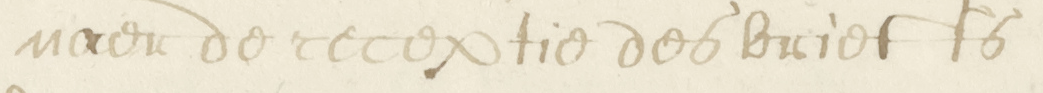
naer de receptie des brieffs.
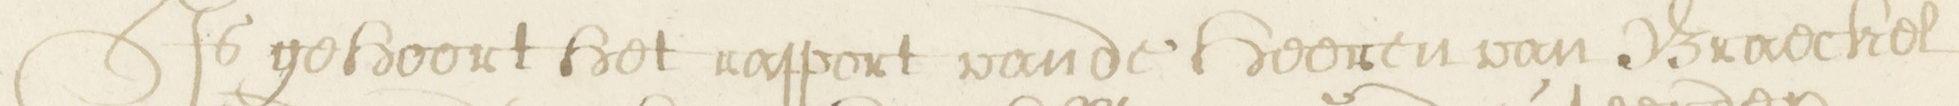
Is gehoort het rapport vande Heeren van Braeckel
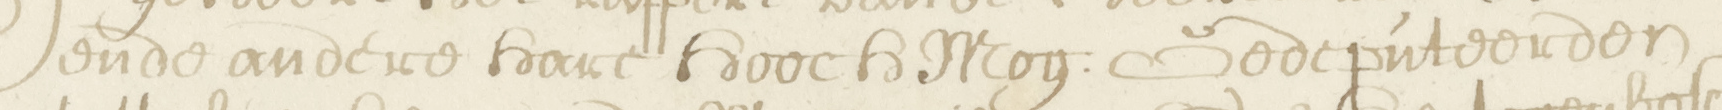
ende andere hare Hooch Mog: Gedeputeerden
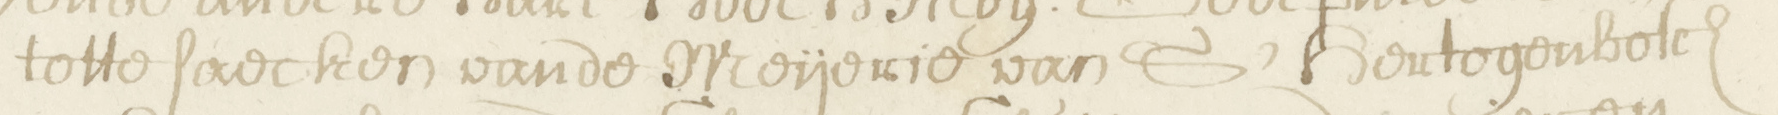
totte saecken vande Meijerie van S'Hertogenbosch
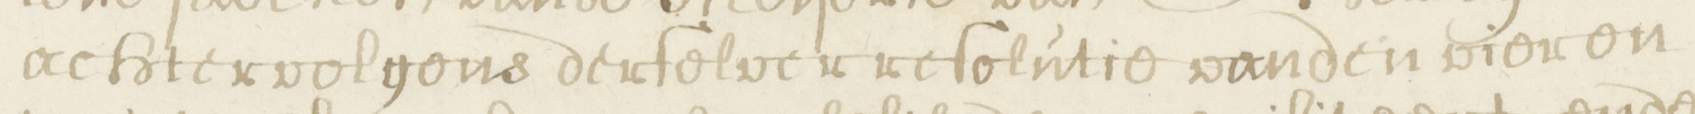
achtervolgens derselver resolutie vanden vieren
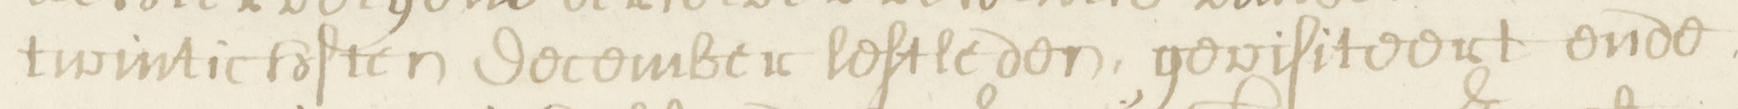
twintichsten December lestleden, gevisiteert ende
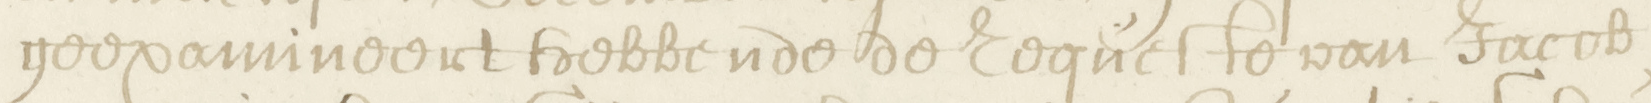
geexamineert hebbende de Requeste van Jacob
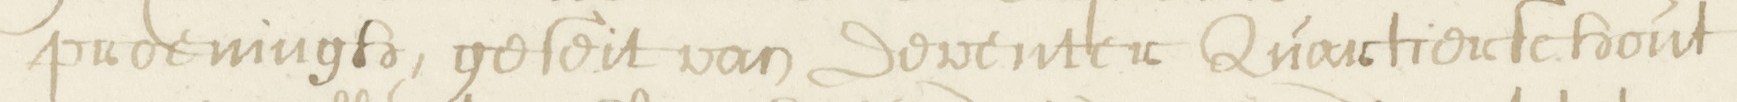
proeningh, geseit van Deventer Quartierschout
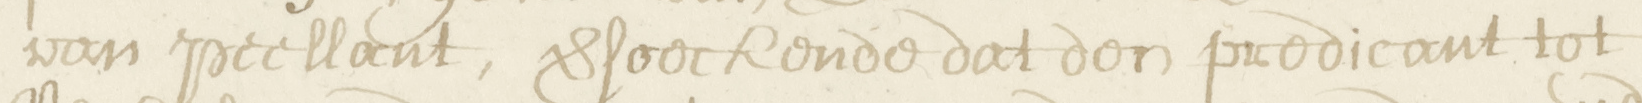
van Peellant, vsoeckende dat den predicant tot
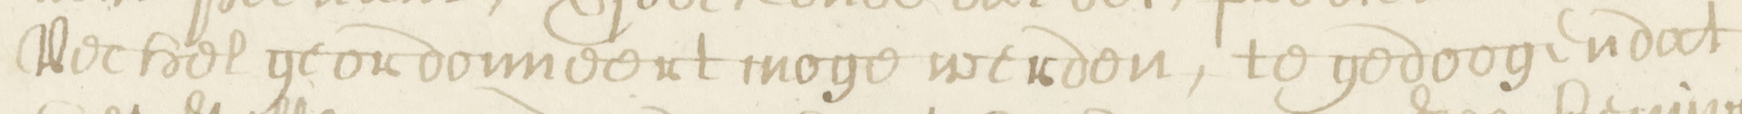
Vechel geordonneert moge werden, te gedoogen dat
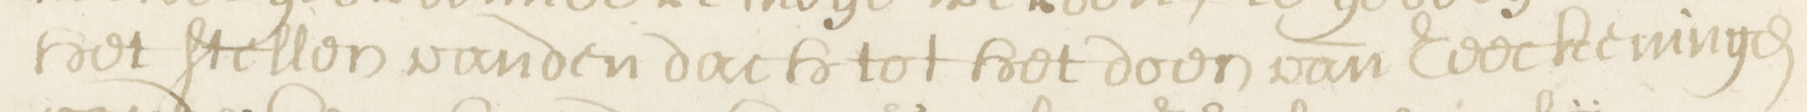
het stellen vanden dach tot het doen van Reeckeningen
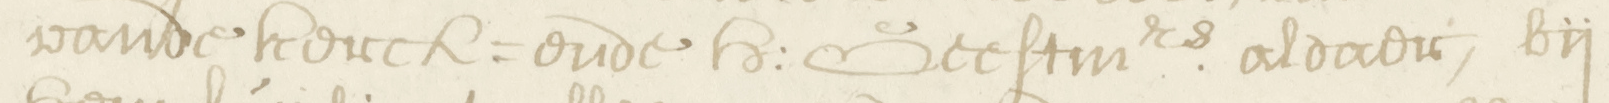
vande kerck, ende h: Geestm.rs aldaer, bij
